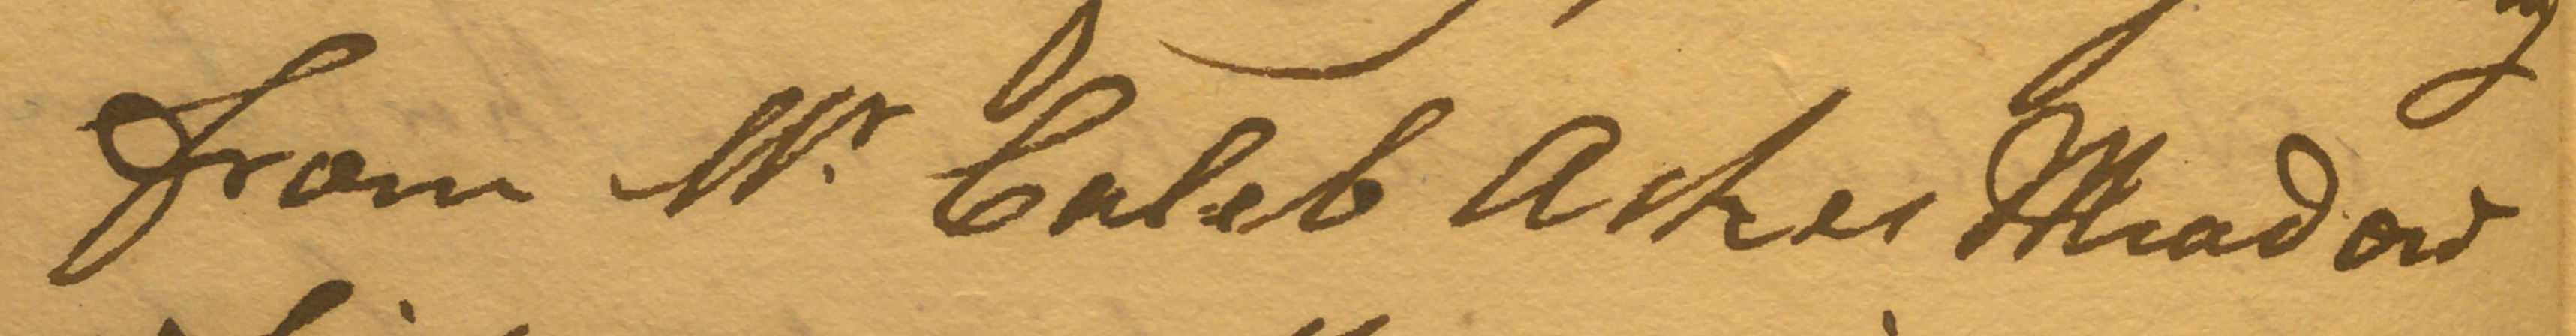from M^r. Caleb Ashes Meadow
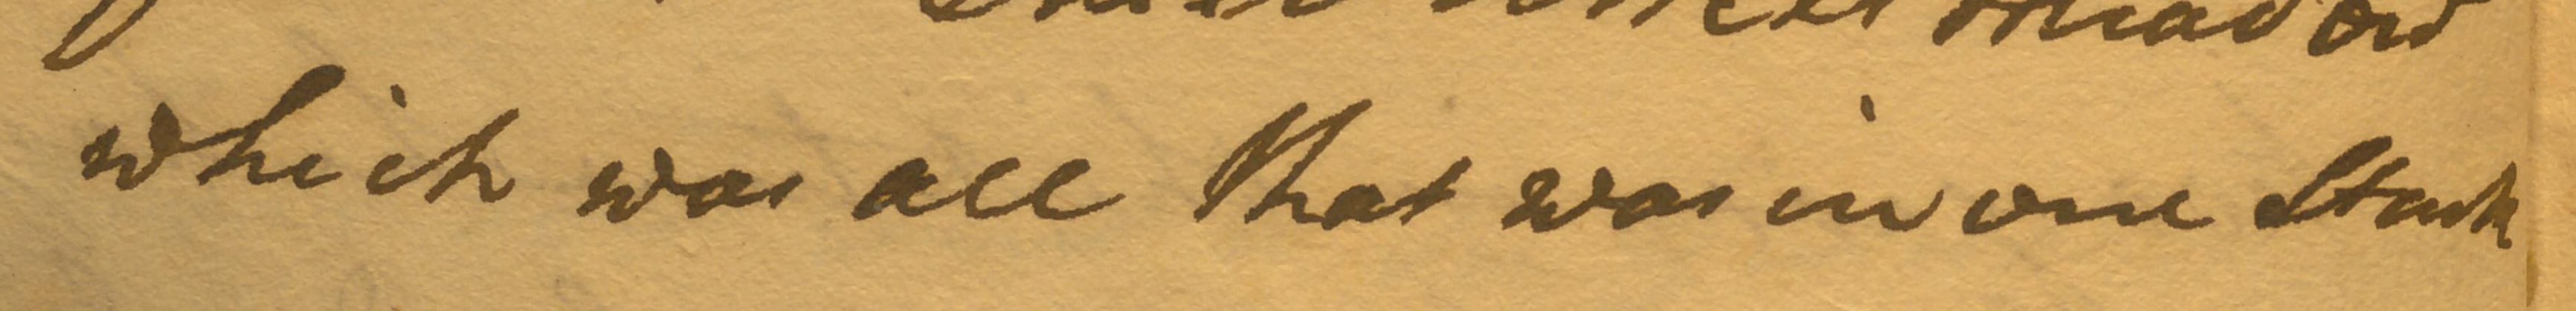which was all that was in one Stack
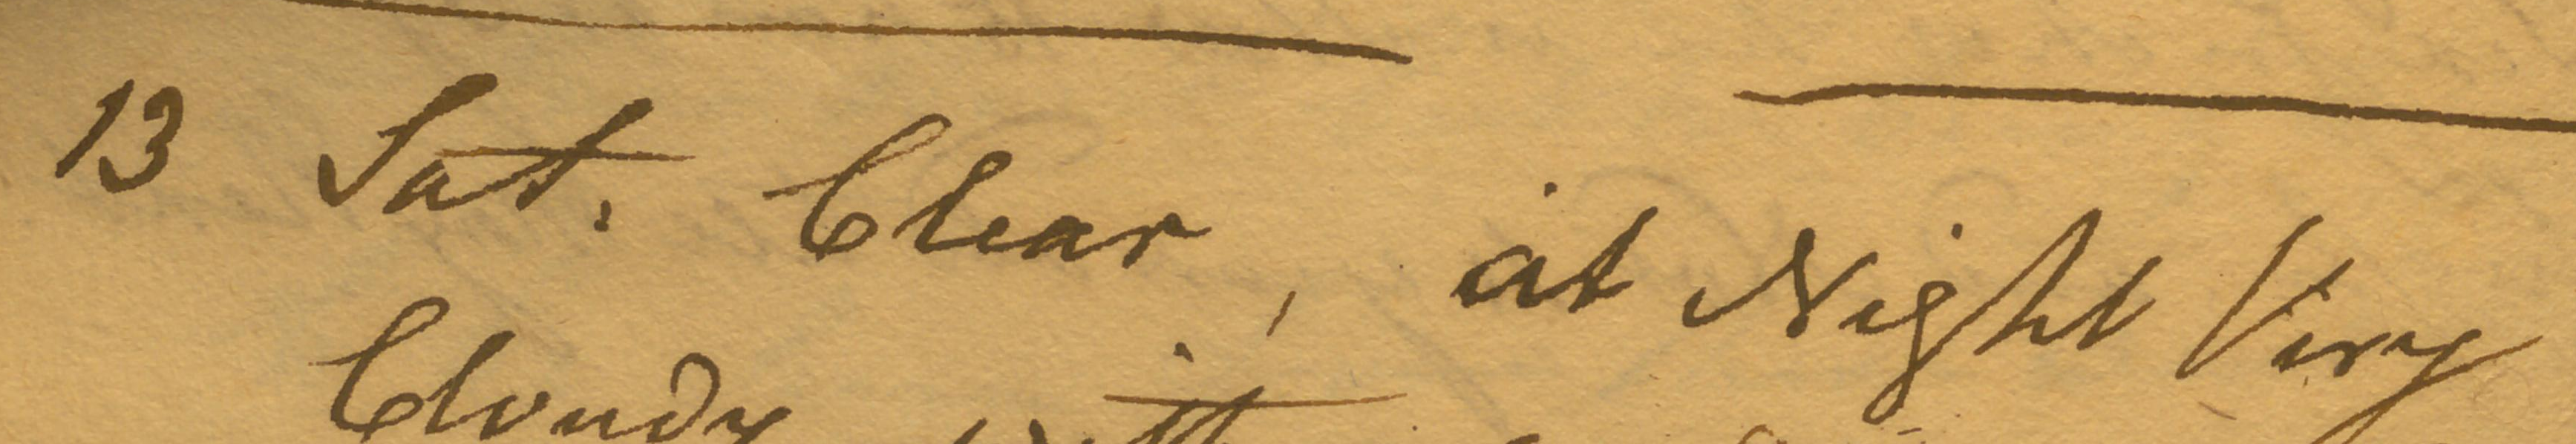13 Sat. Clear at Night Very
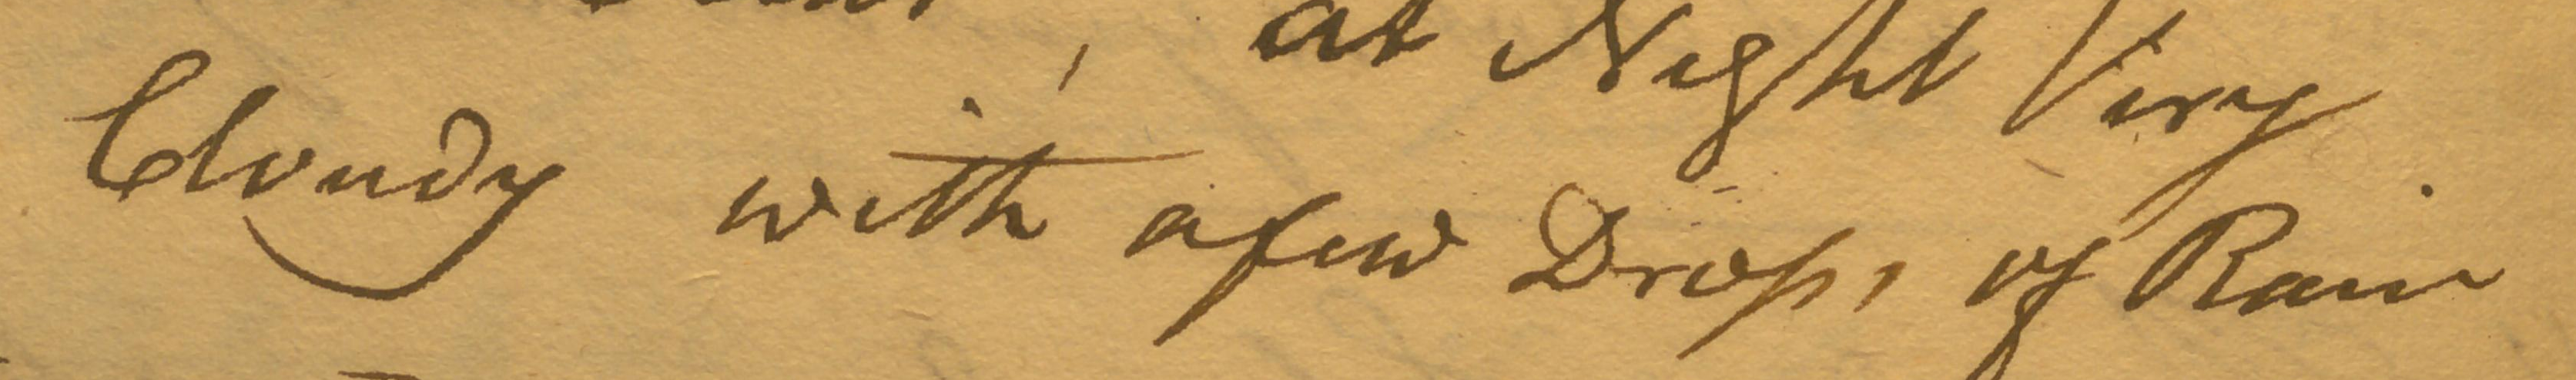Cloudy with a few Drops of Rain
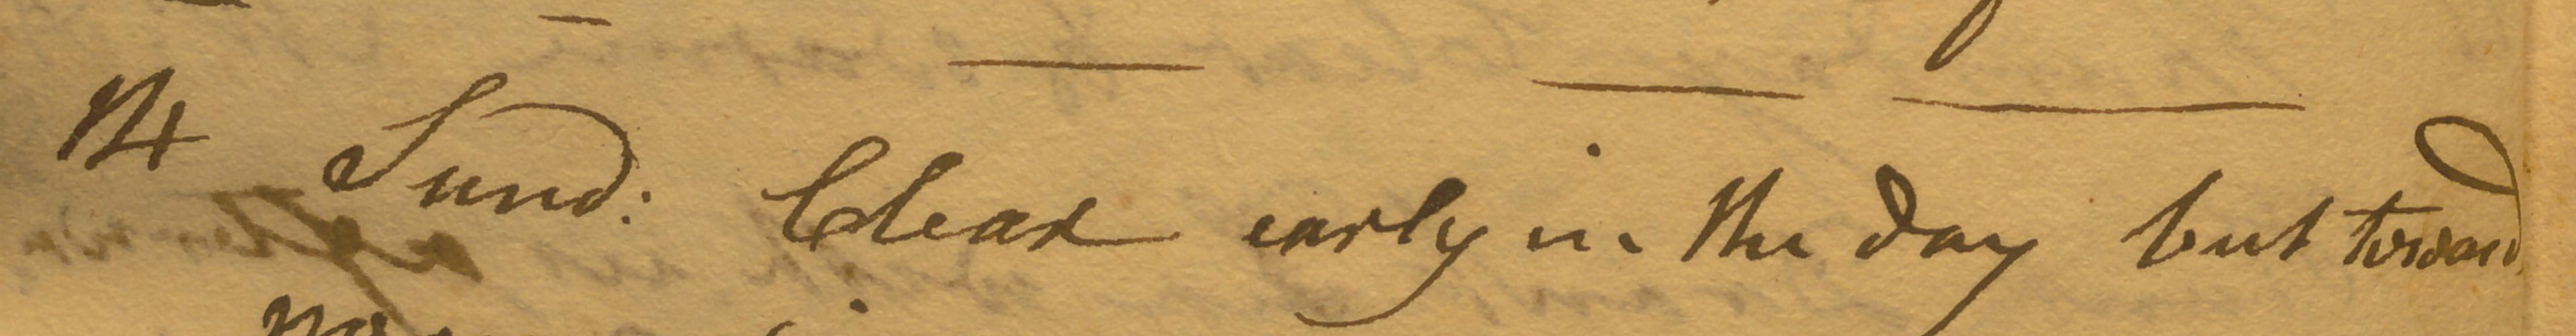14 Sund. Clear early in the day but toward
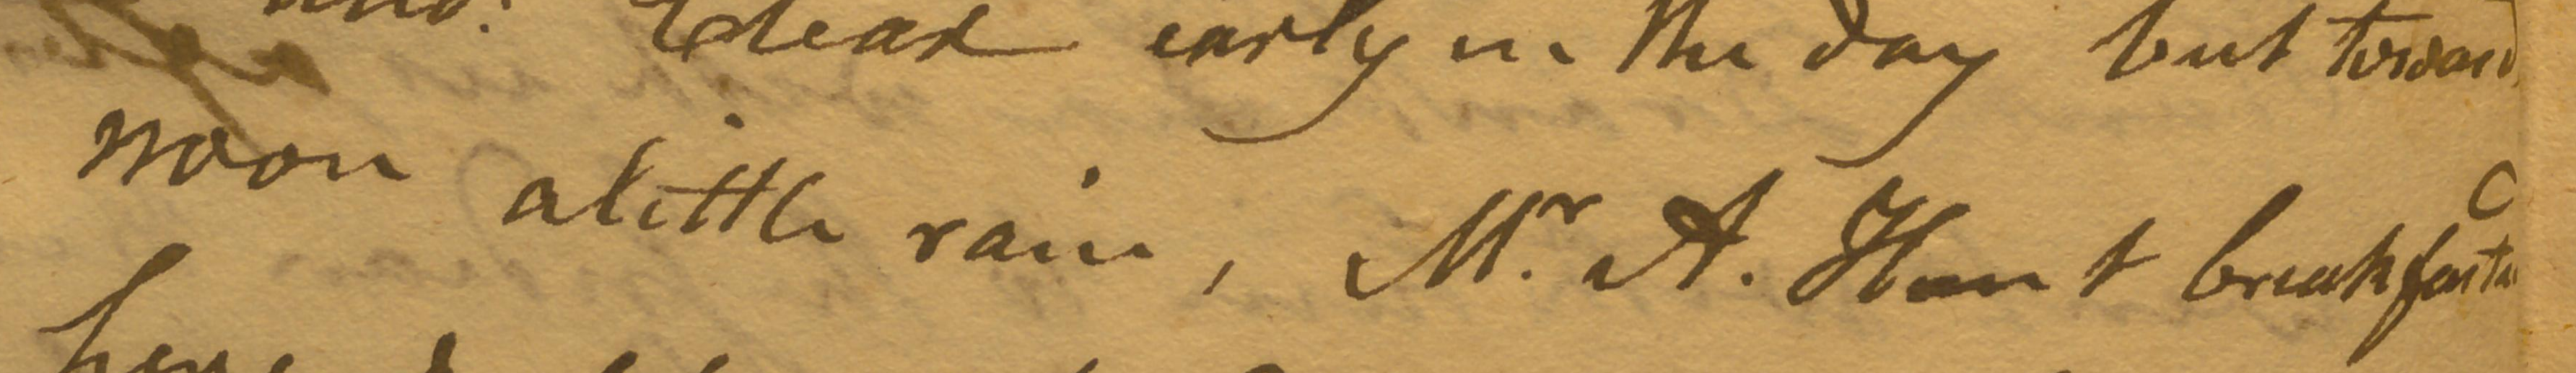noon a little rain, M^r. A. Hant breakfasted
